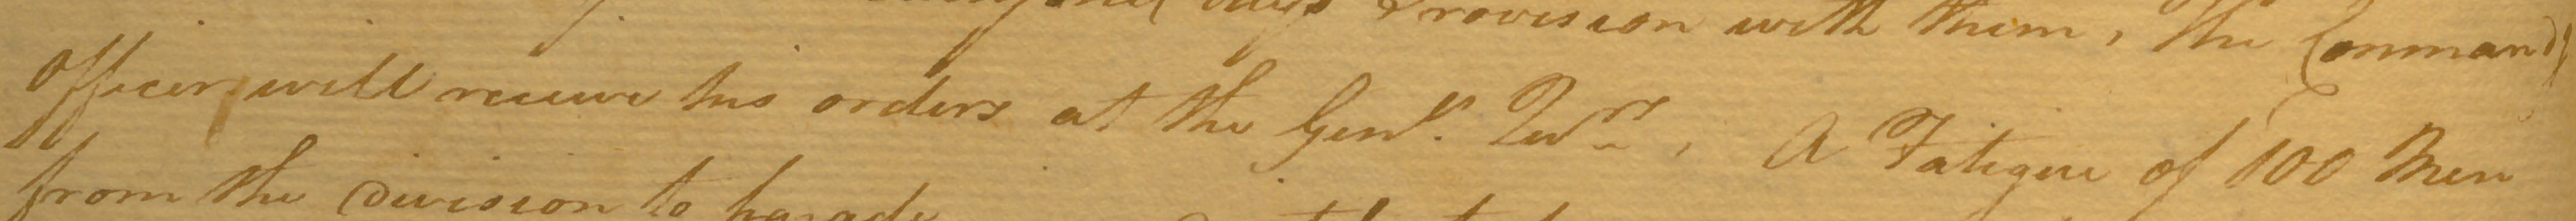Officer will review his orders at the Gen^l. Qu^rs. A Fatigue of 100 Men
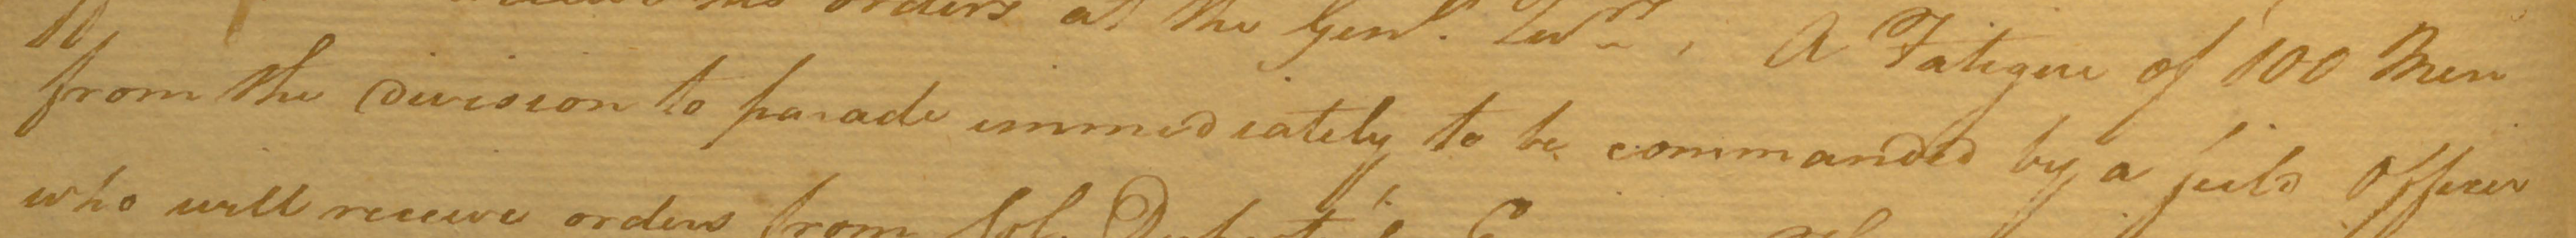from the division to parade immediately to be commanded by a field Officer
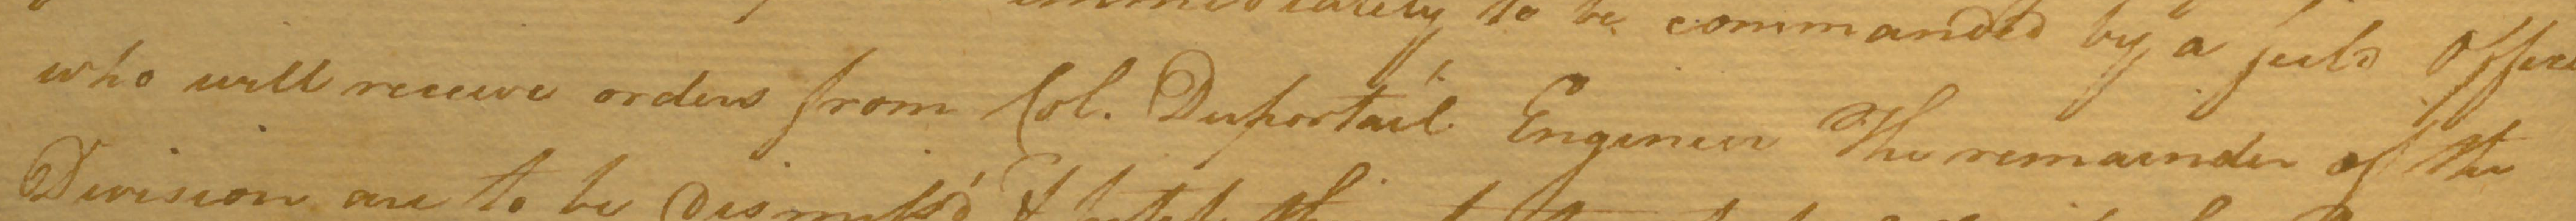who will receive orders from Col. Duportail Engineer The remainder of the
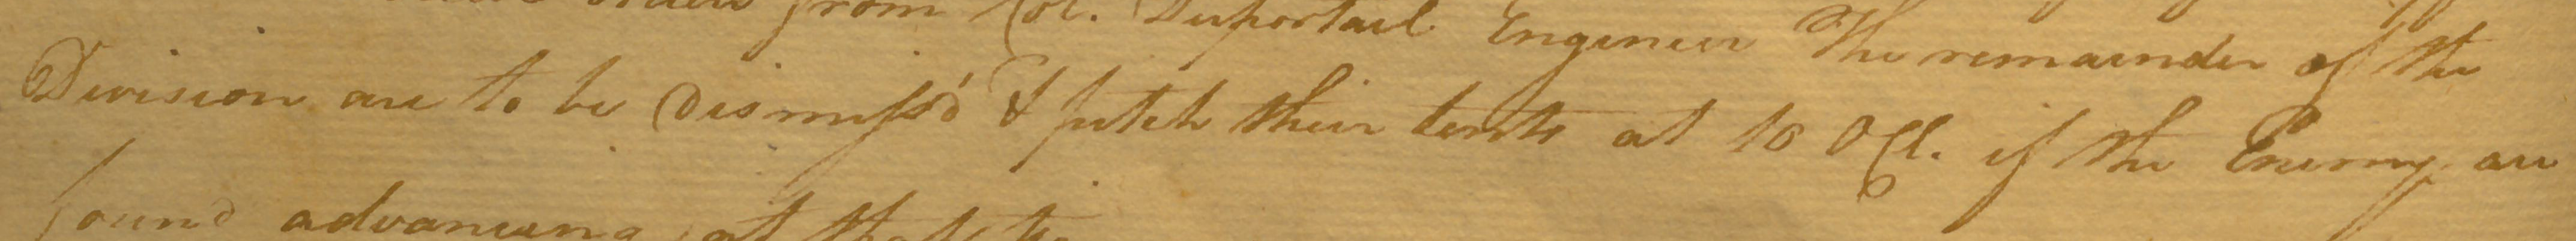Division are to be dismiss'd & fetch their tents at 10 oCl. if the Enemy are
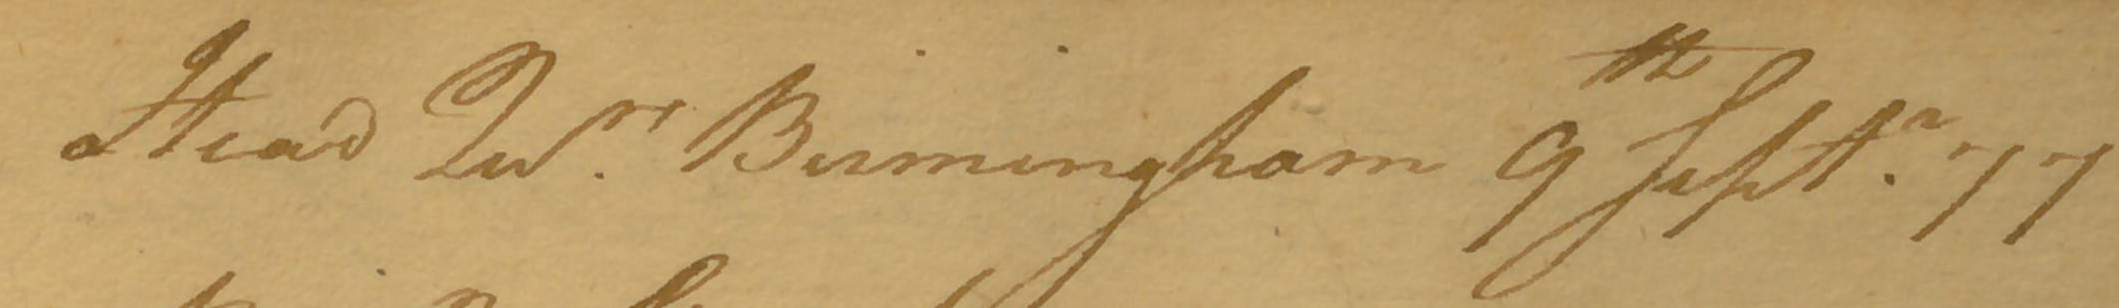Head Qu^rs. Birminghan 9^th Sept^r. 77
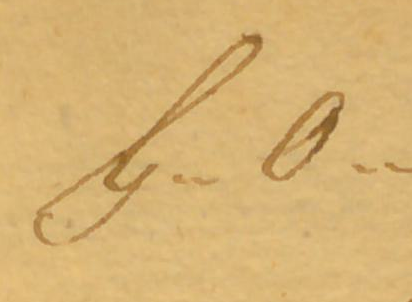G.O.
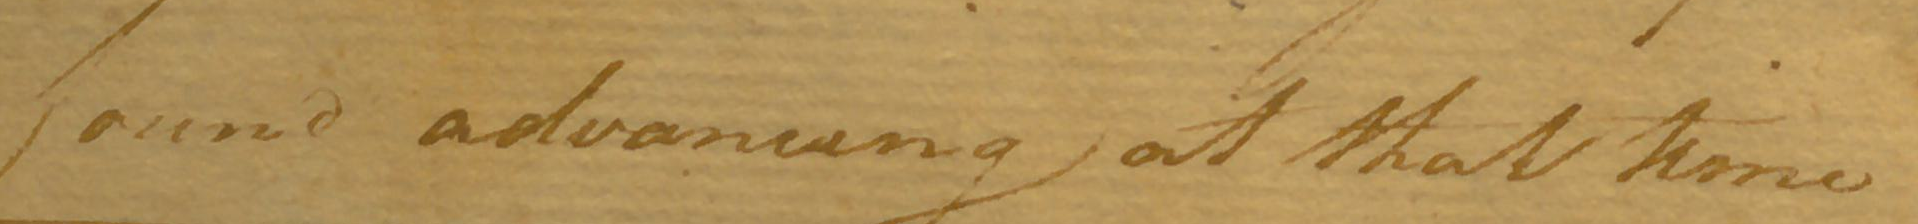found advancing at that time
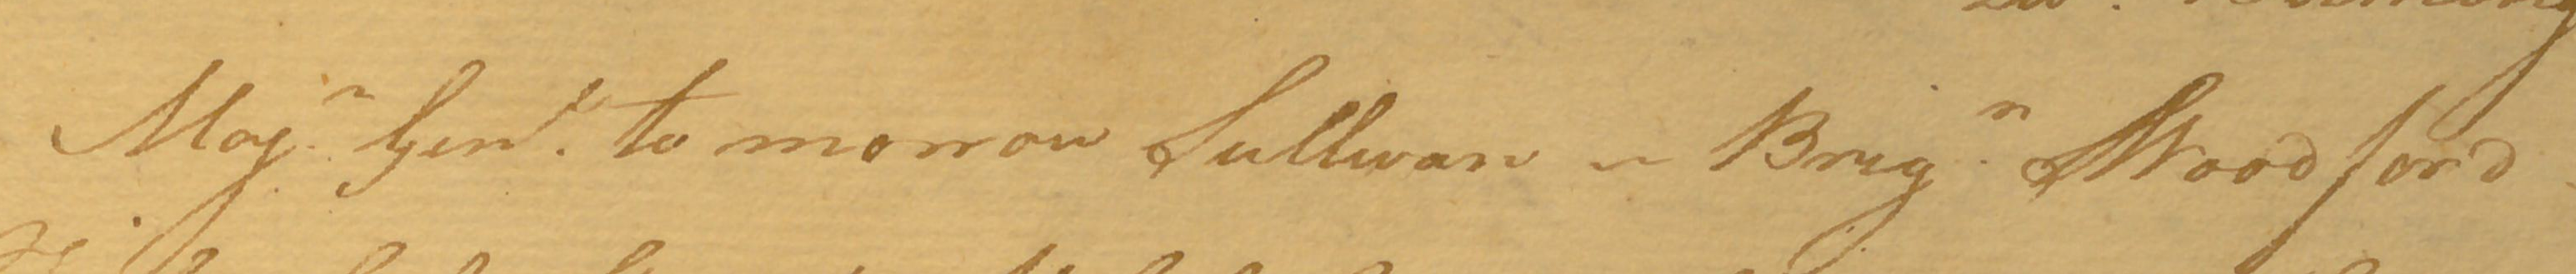Maj^r. Gen^l. to morrow Sullivan . Brig^r. Woodford
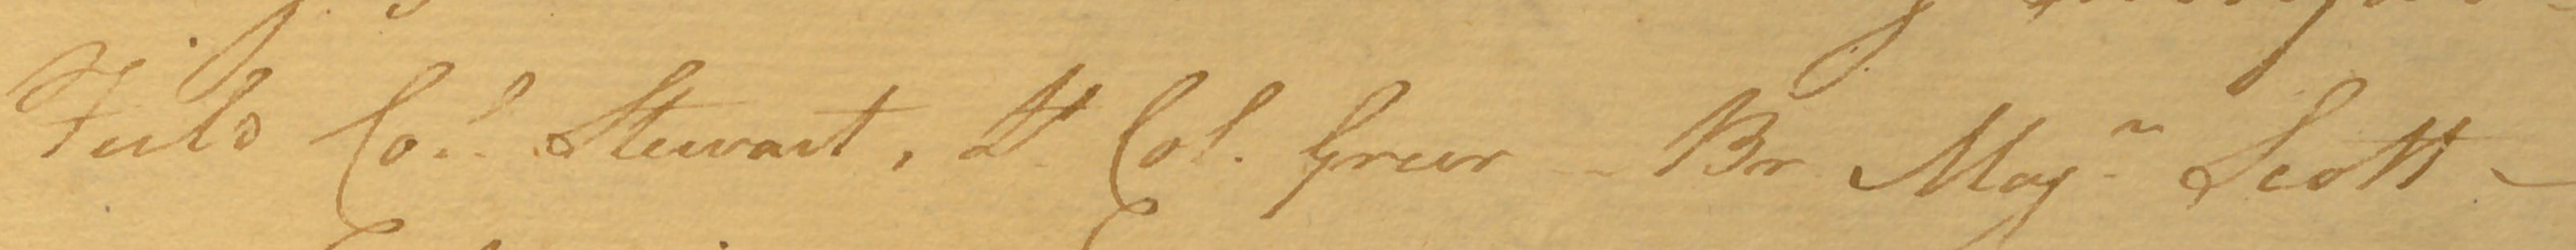Field Col. Stewart, L^t. Col. Green. Br Maj^r. Scott-
